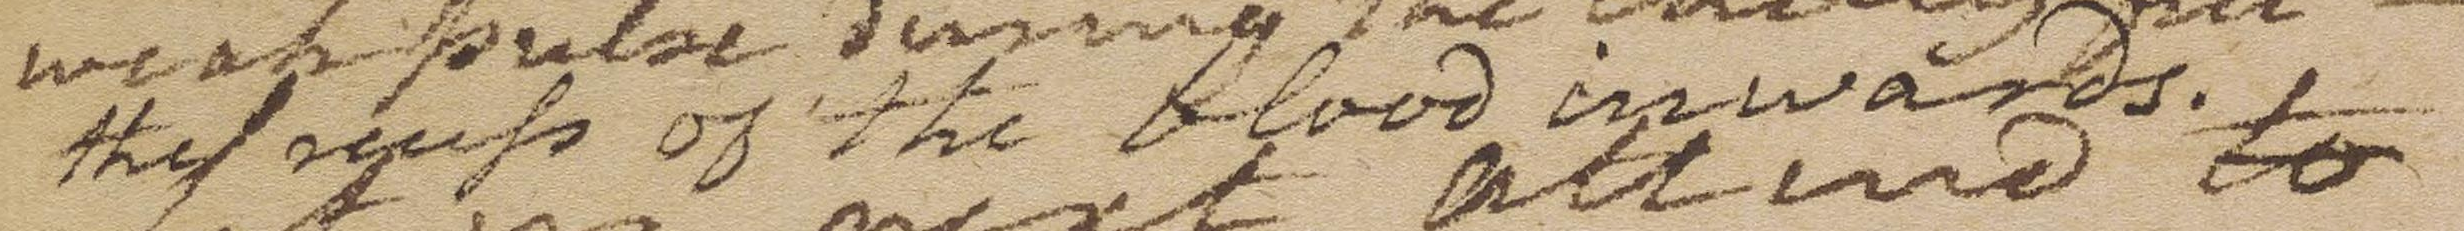the recess of the blood inwards.
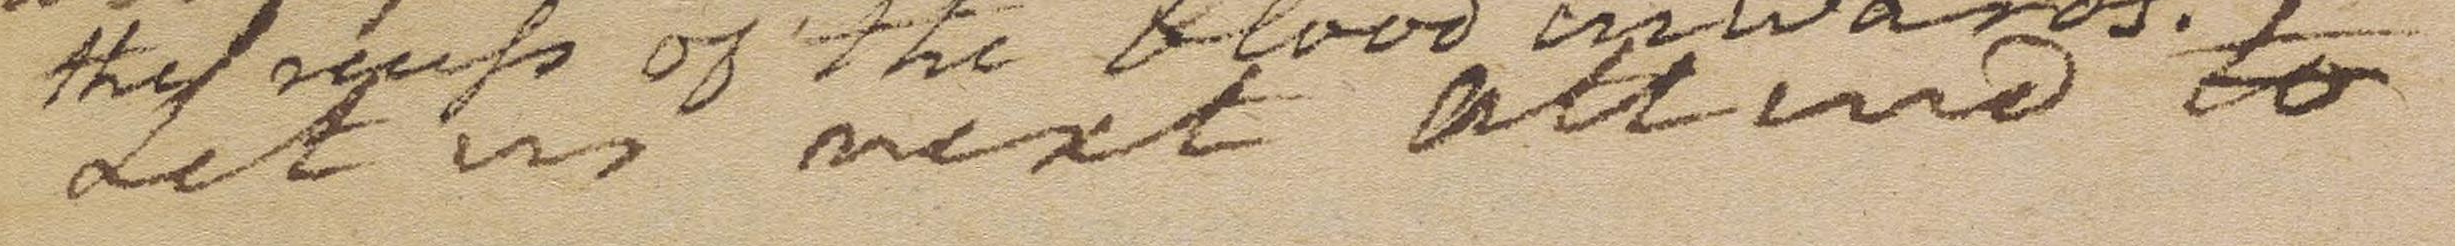Let us next attend to
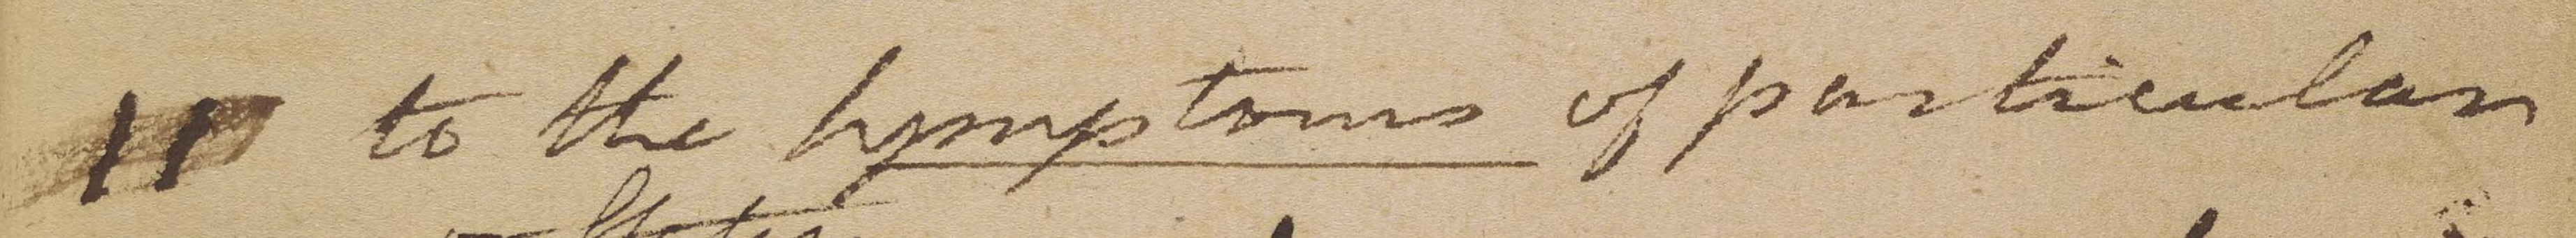II to the symptoms of particular
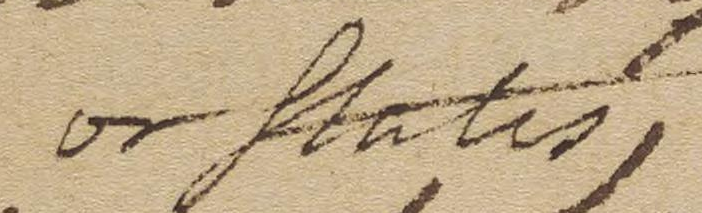or states
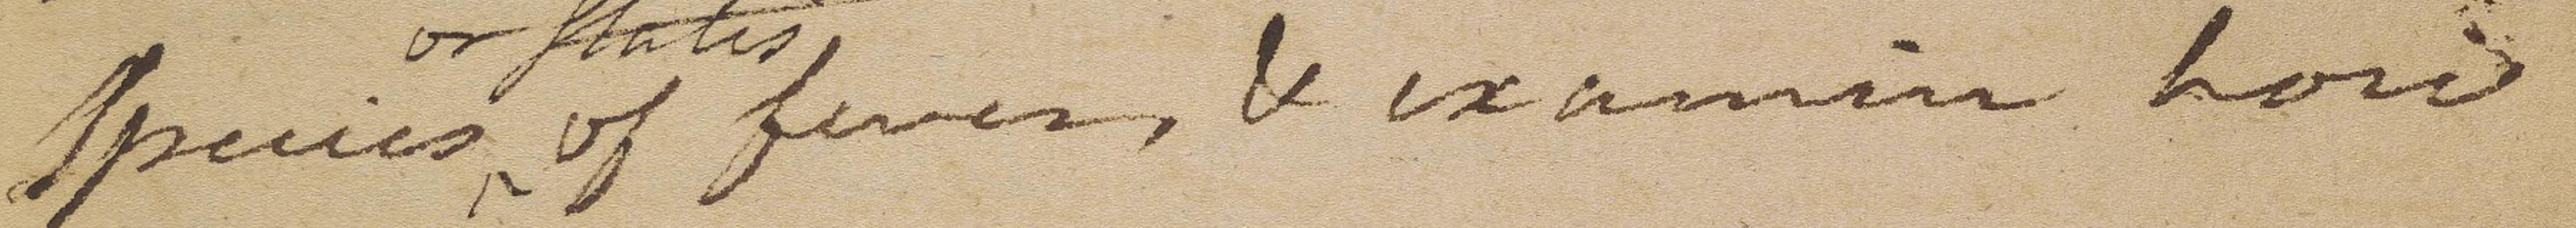species ^ of fever, & examine how
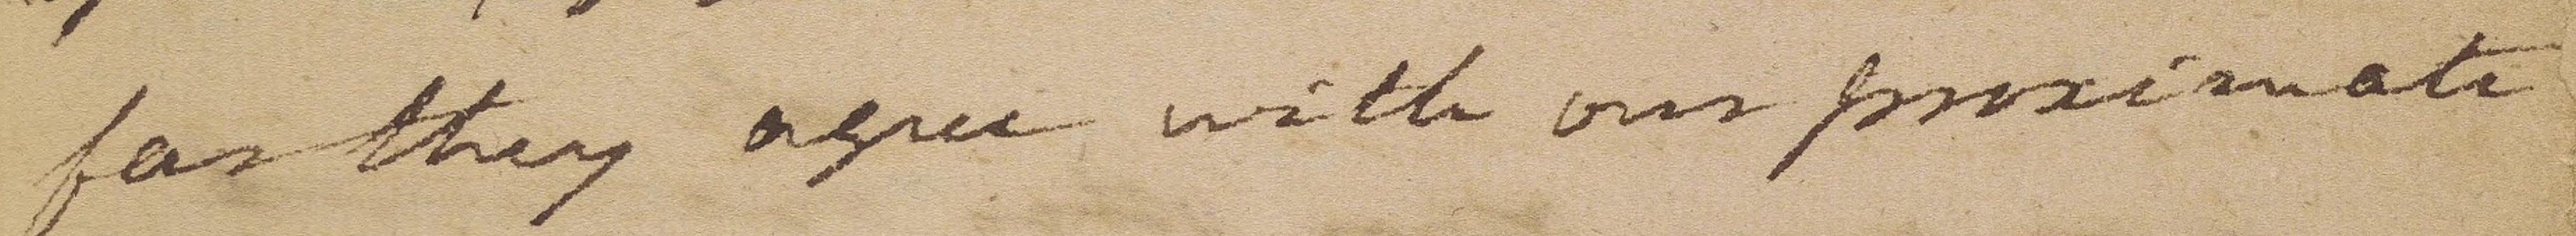far they agree with our proximate
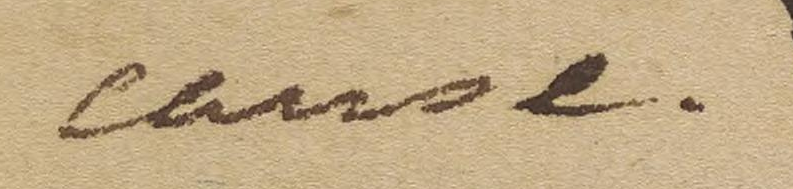cause. V
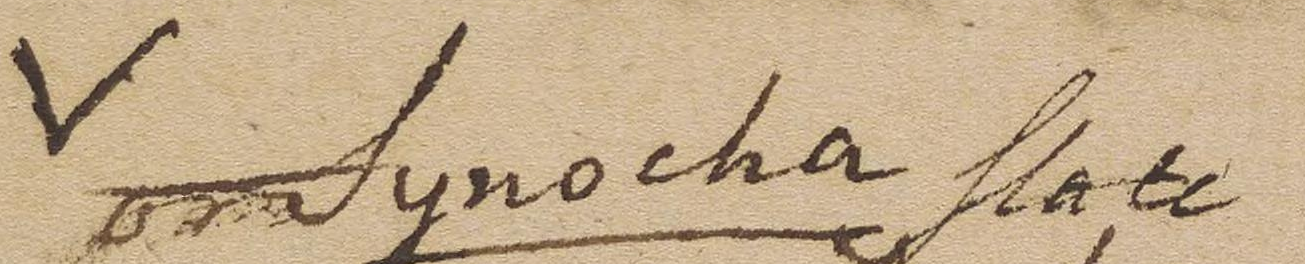Synocha State
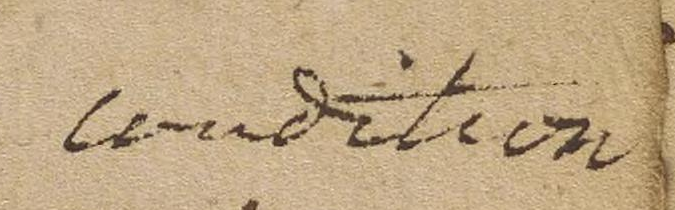condition
